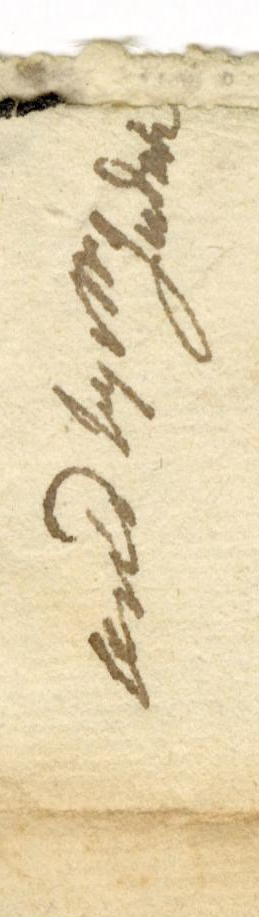hond by M^r Judah
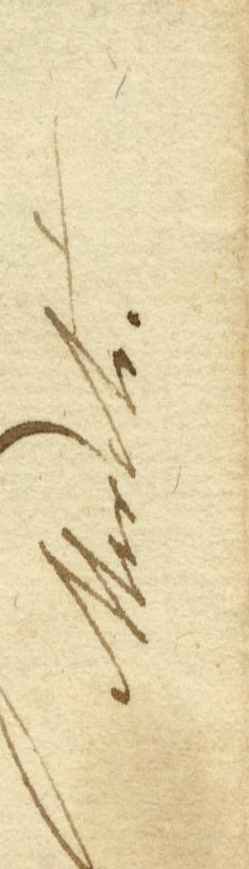Merch^t
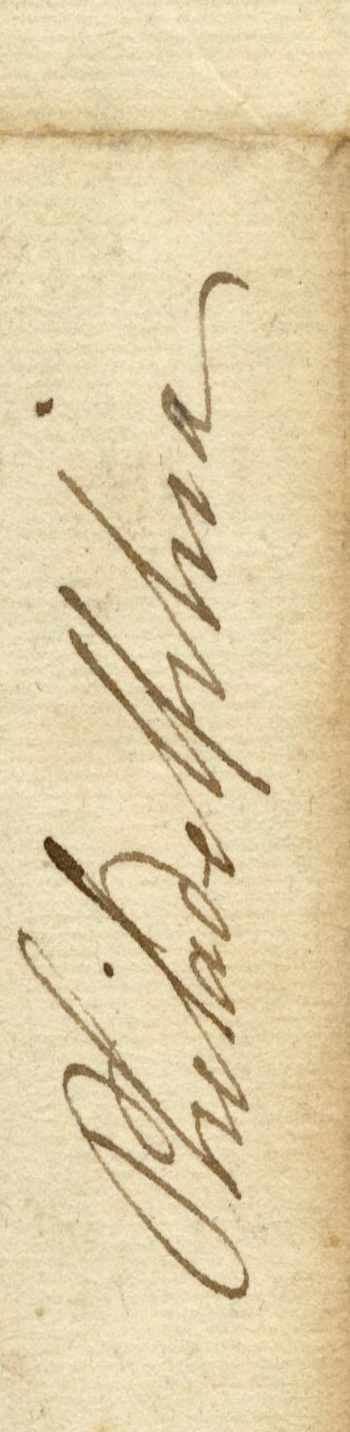Philadelphia
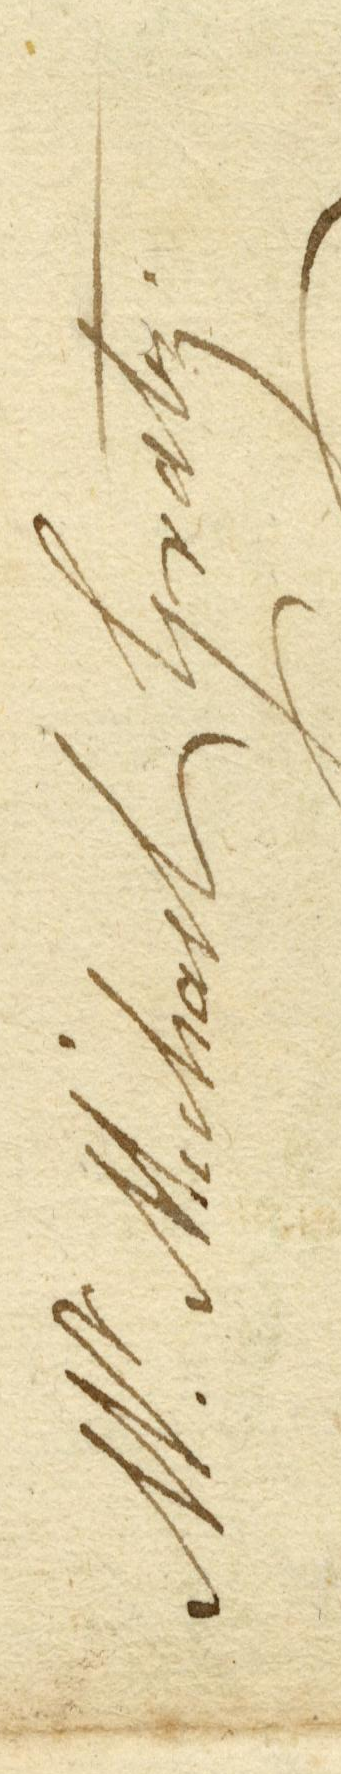M^r Michael Gratz
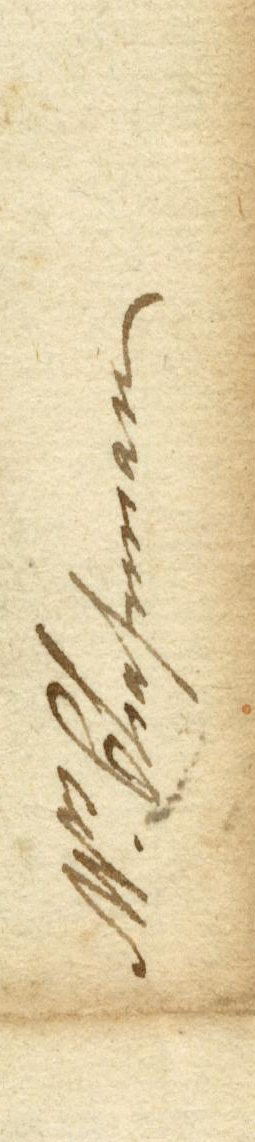M^r Chapman
